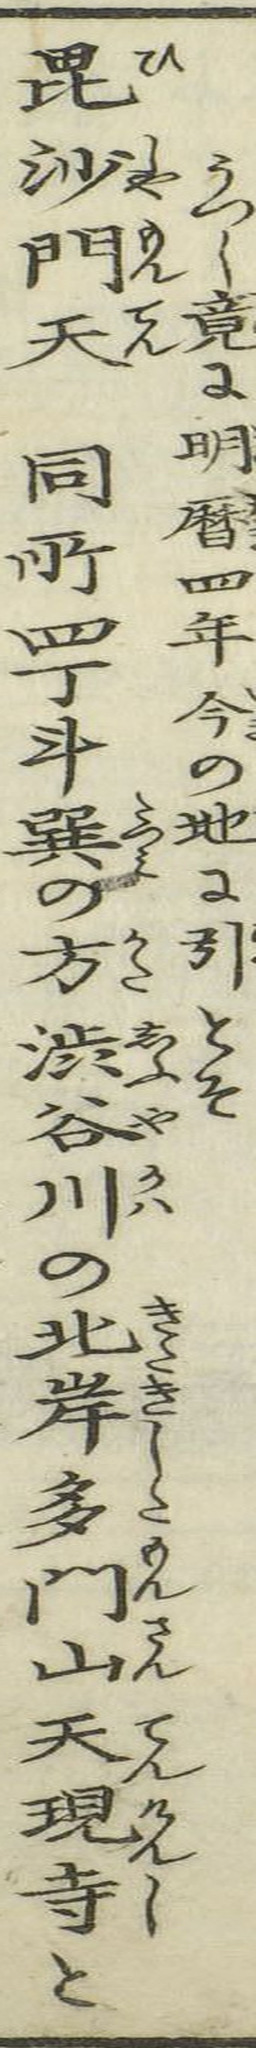毘沙門天同所四丁斗巽の方渋谷川の北岸多門山天現寺と
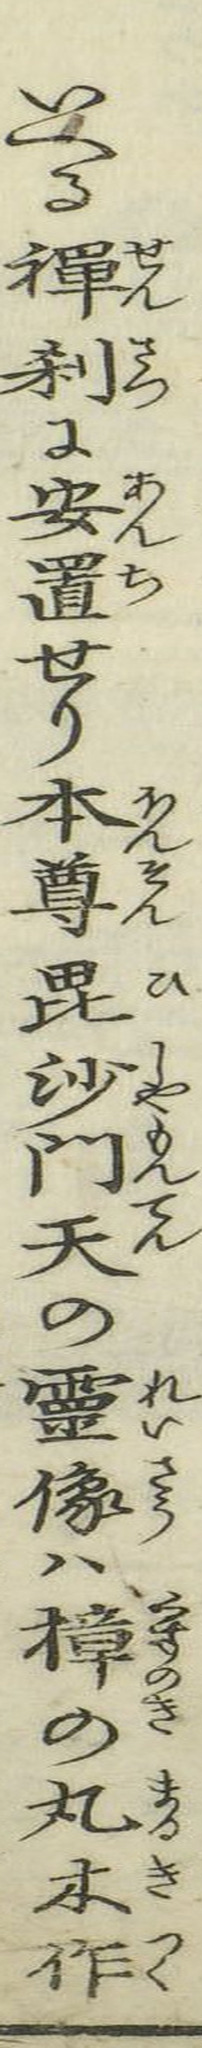いへる禪刹に安置せり本尊毘沙門天の靈像は樟の丸木作
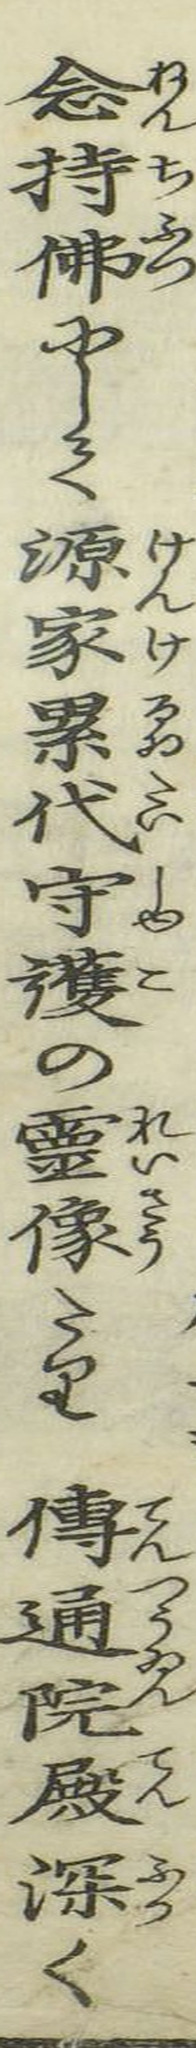念持佛にして源家累代守護の靈像たり傳通院殿深く

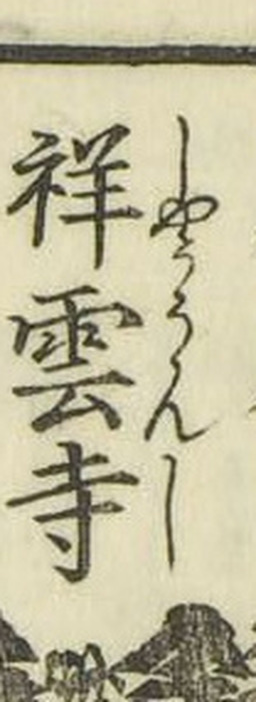祥雲寺

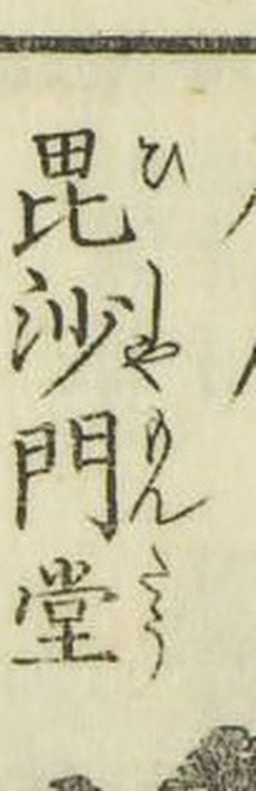毘沙門堂

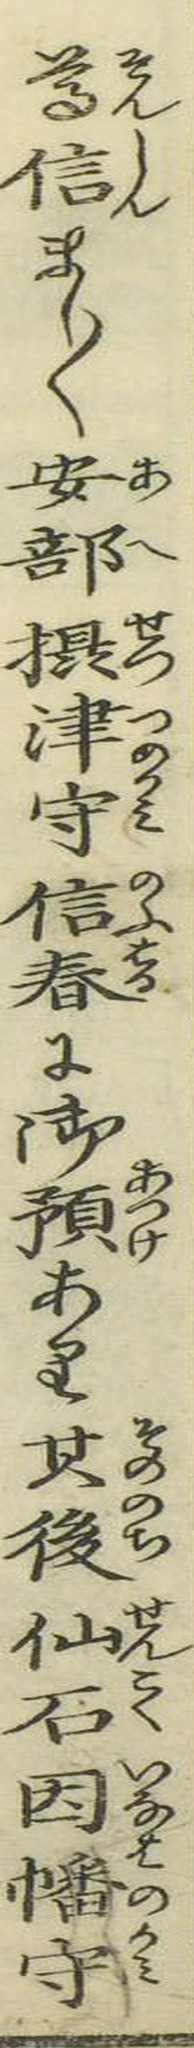尊信まし〳〵安倍摂津守信春に御預あり其後仙石因幡守
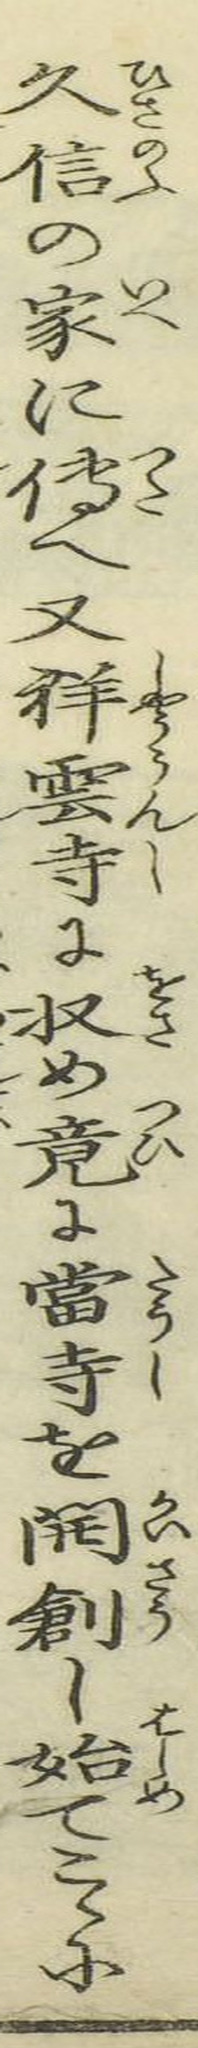久信の家に傳へ又祥雲寺に収め竟に當寺を開創し始てこゝに
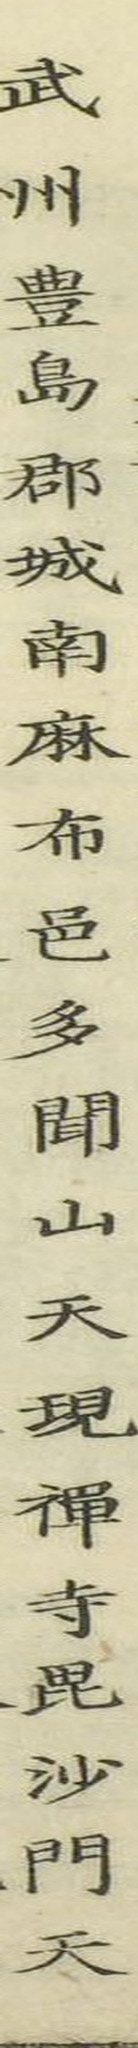武州豊島郡城南麻布邑多聞山天現禪寺毘沙門天
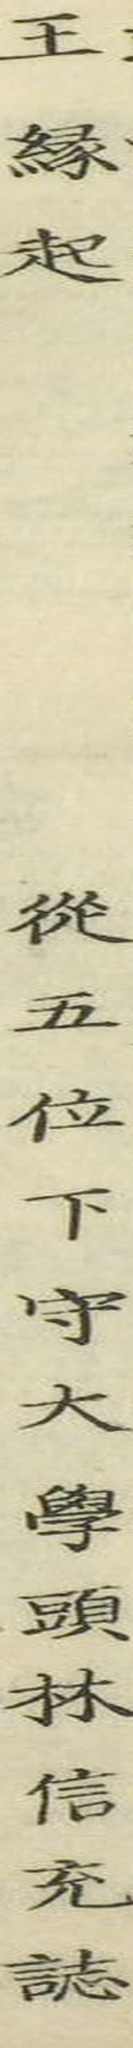王縁起從五位下守大學頭林信充誌
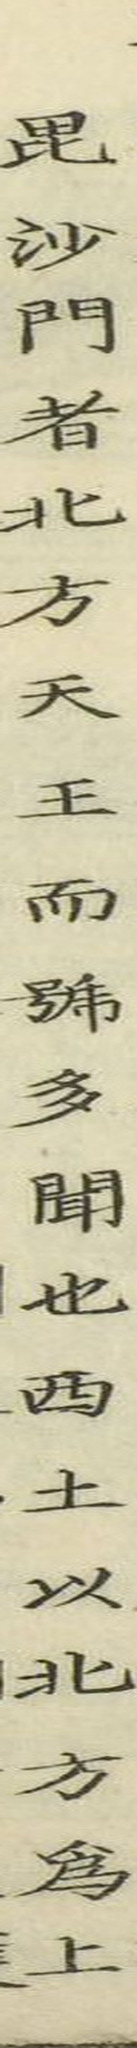毘沙門者北方天王而號多聞也西土以北方爲上
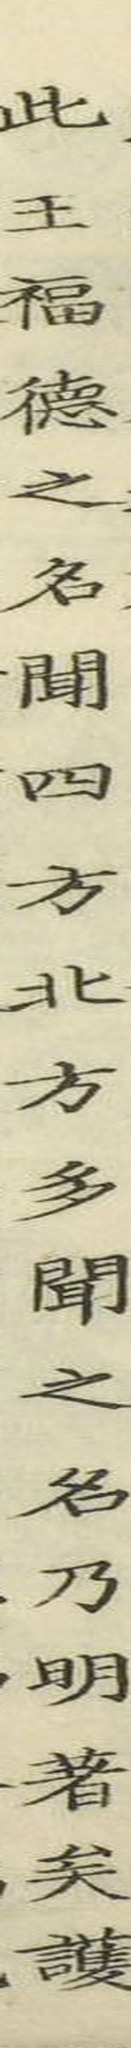此王福德之名聞四方北方多聞之名乃明著矣護
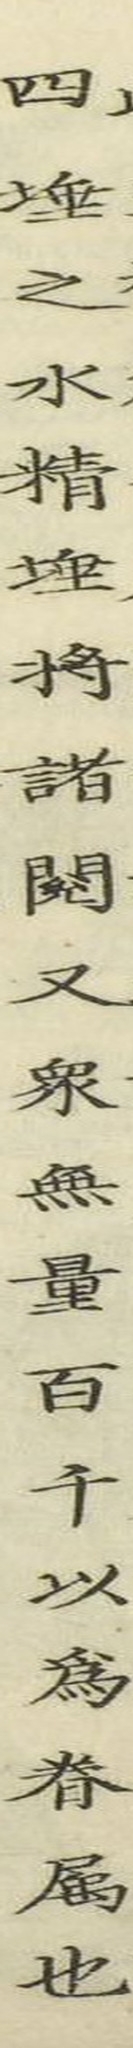四埵之水精埵將諸閱又衆無量百千以爲眷属也
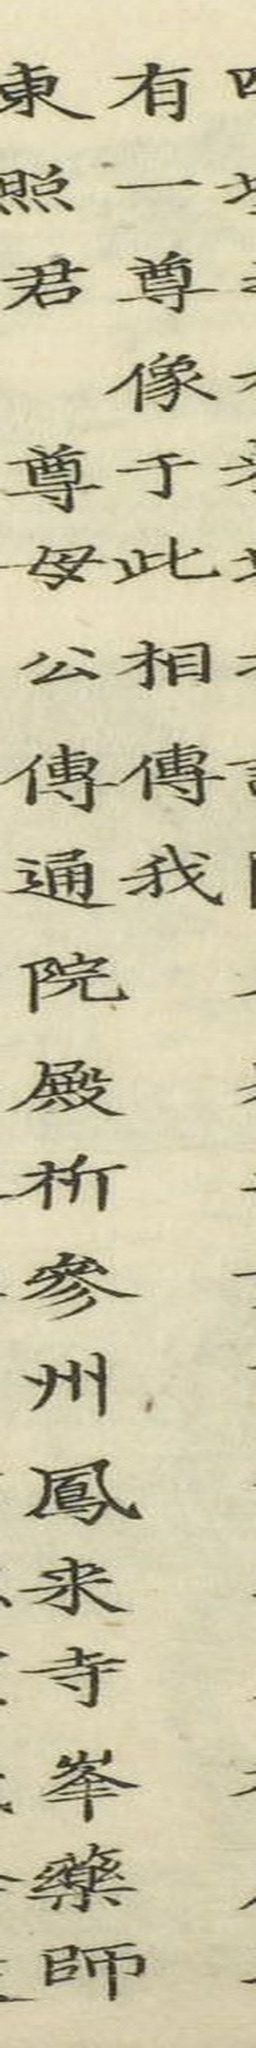東照君尊母公傳通院殿析參州鳳来寺峯藥師
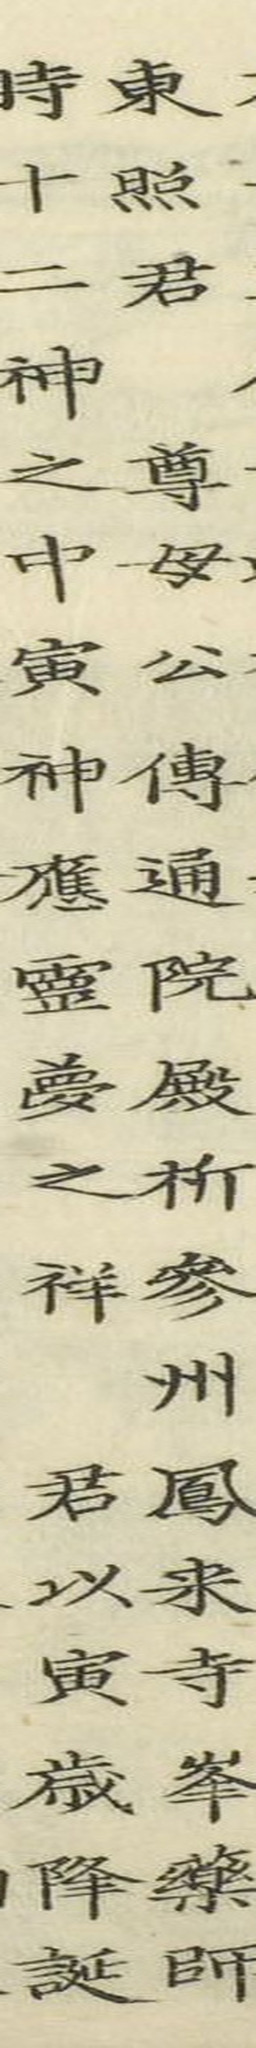時十二神之中寅神應靈夢之祥君以寅歳䧏誕
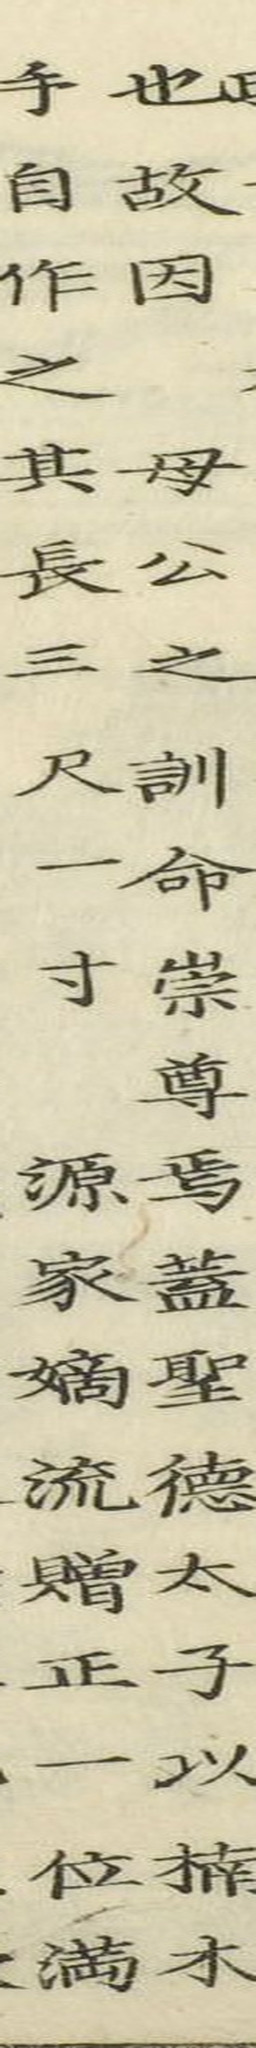手自作之其長三尺一寸源家嫡流贈正一位満
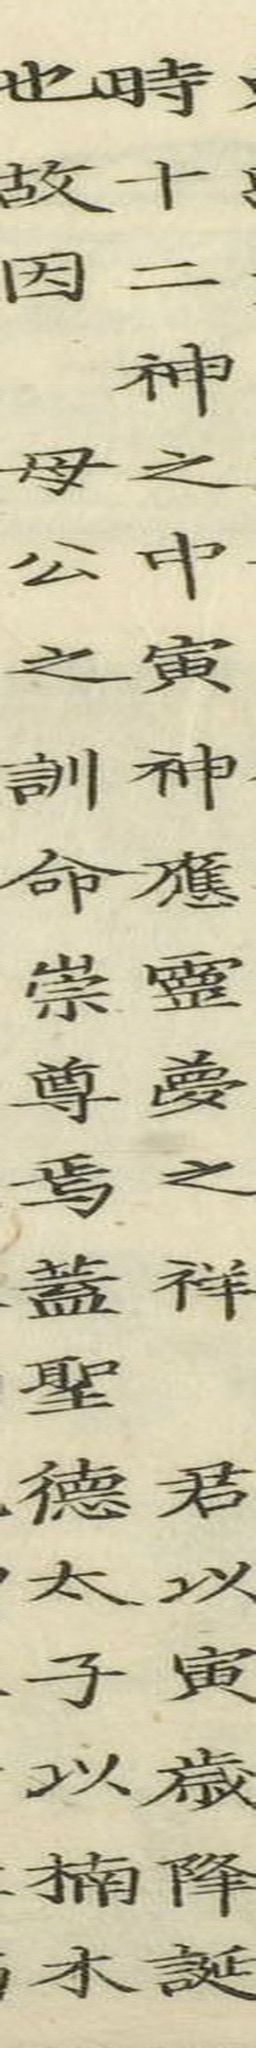也故因母公之訓命崇尊焉蓋聖德太子以楠木
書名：江戸名所図会 20巻 巻之7
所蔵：東京学芸大学教育コンテンツアーカイブ
